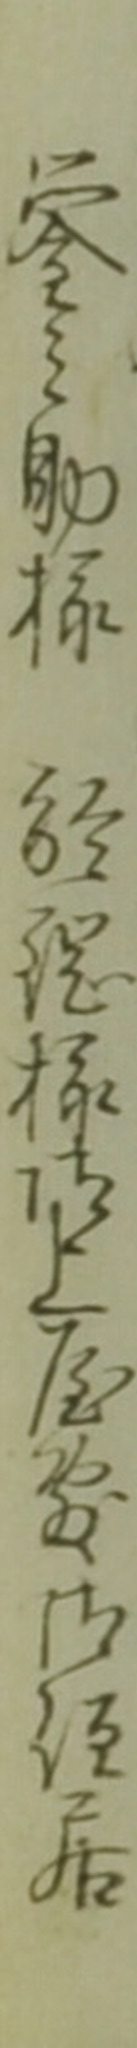鎣之助様於綱様御上屋敷御住居

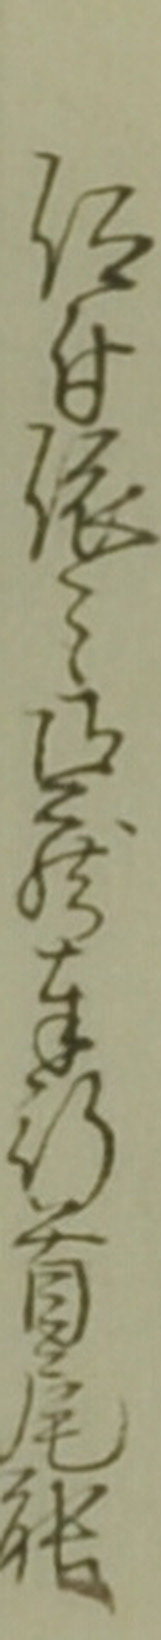仰付依之御蔵奉行首尾能御免
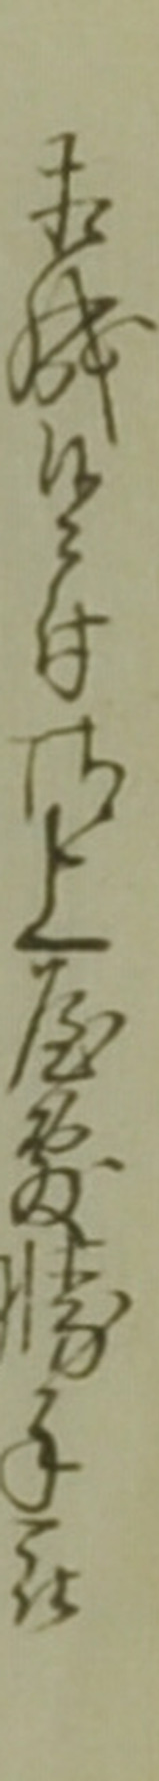相成候ニ付御上屋敷勝手被
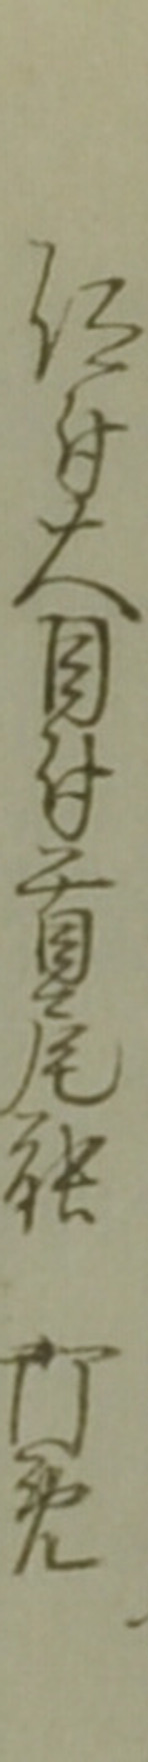仰付大目付首尾能御免
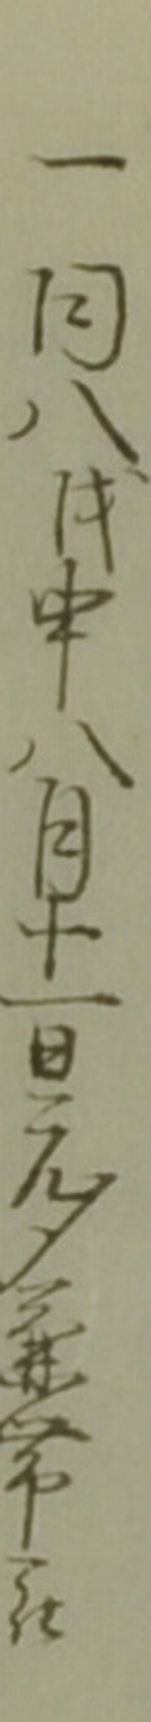一同八戊申八月十一日元〆兼帯被仰付
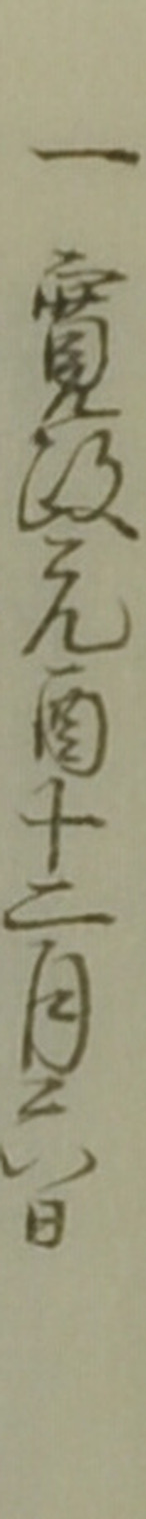一寛政元酉十二月六日
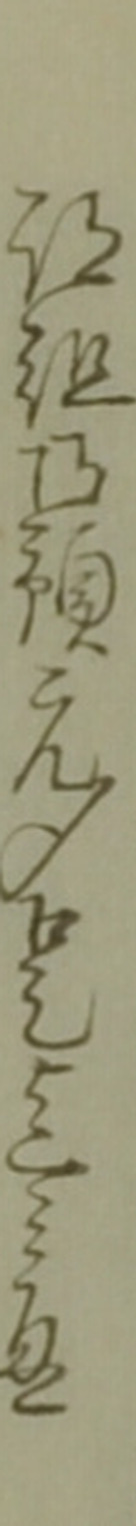跡組御預元〆是迄之通
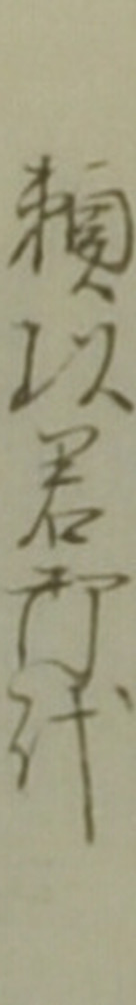頼以君御代
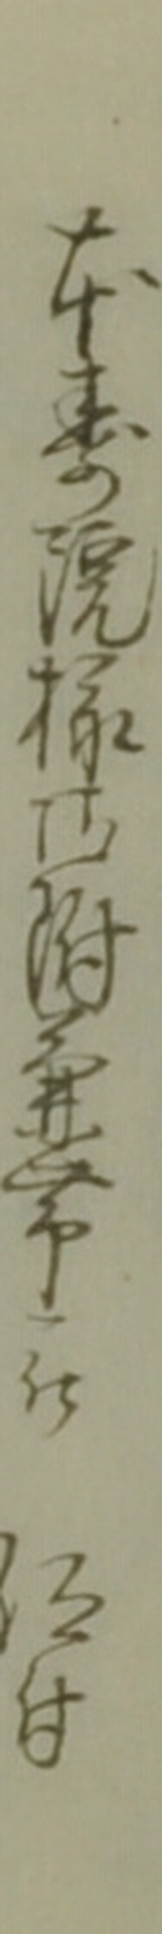本寿院様御附兼帯被仰付
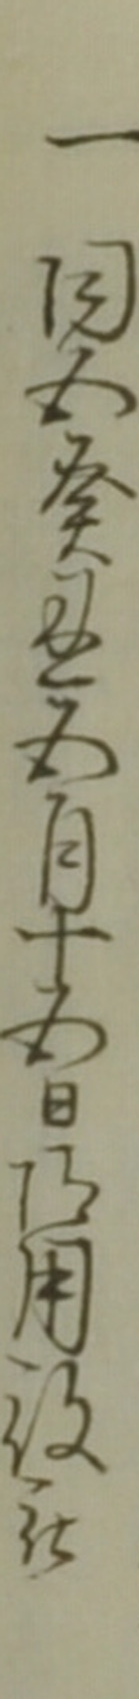一同五癸五月十五日御用役被
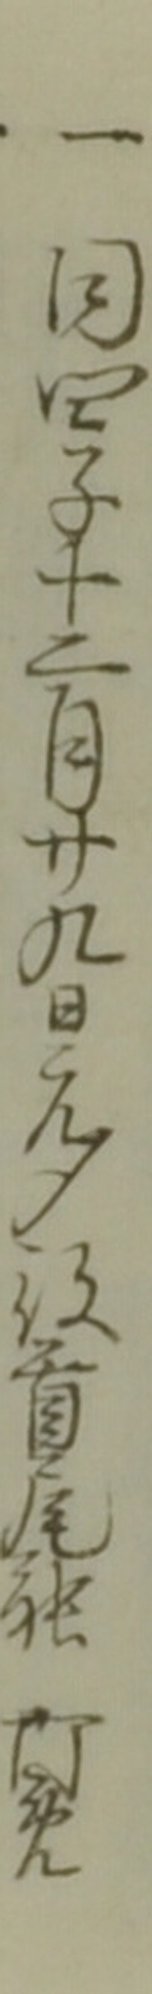一同四子十二月廿九日元〆役首尾能御免
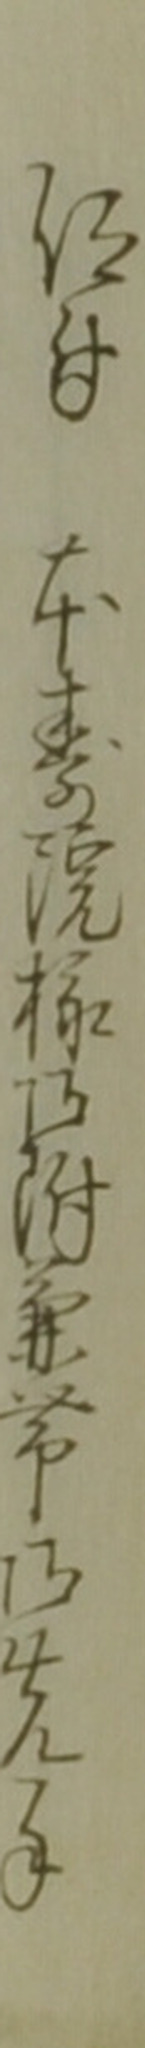仰付本寿院様御附兼帯御先手
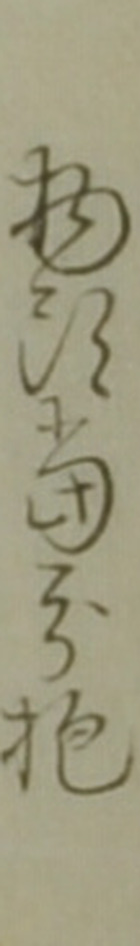物頭当分抱
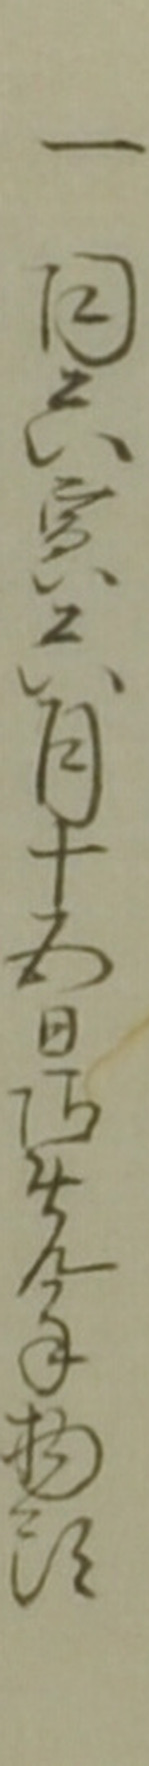一同六寅六月十五日御先手物頭
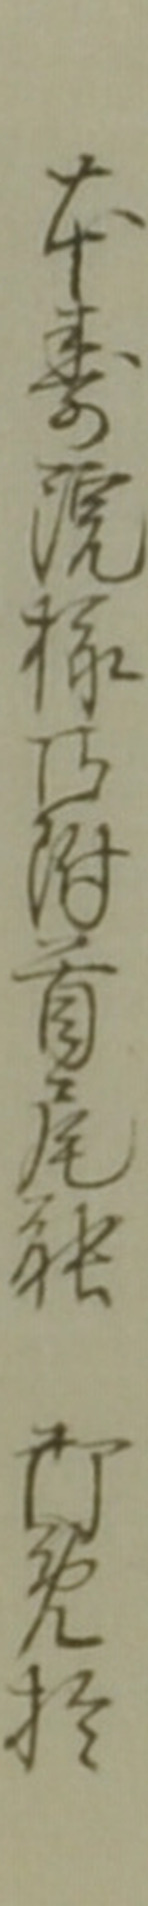本寿院様御附首尾能御免於
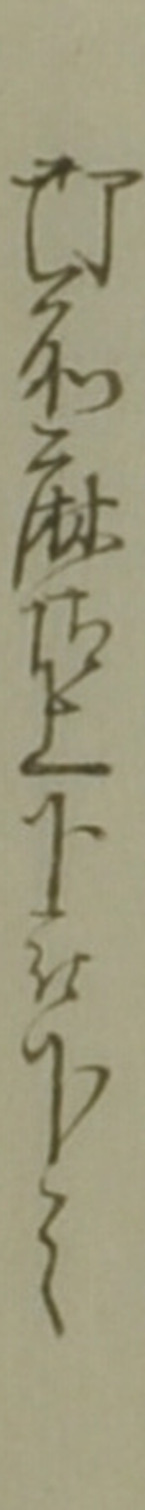御前麻御上下被下之
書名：給人諸士勤仕録（三）
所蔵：伊那市立高遠町図書館・合同会社AMANE
